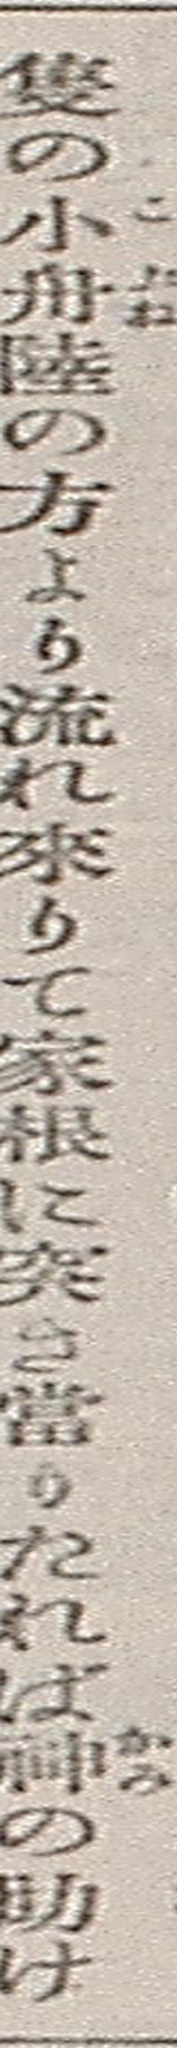隻の小舟陸の方より流れ来りて家根に突き当りたれば神の助け
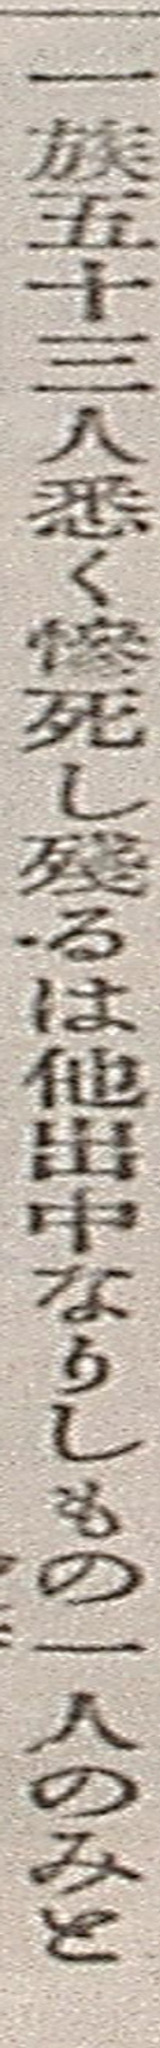一族五十三人悉く惨死し残るは他出中なりしもの一人のみと
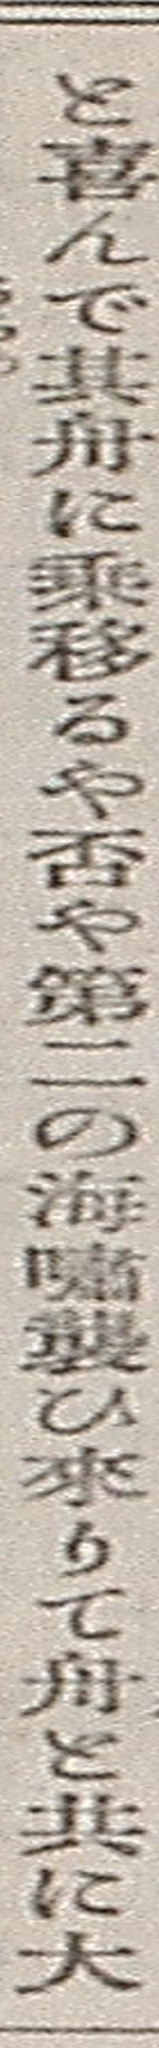と喜んで其舟に乗移るや否や第二の海嘯襲ひ来りて舟と共に大
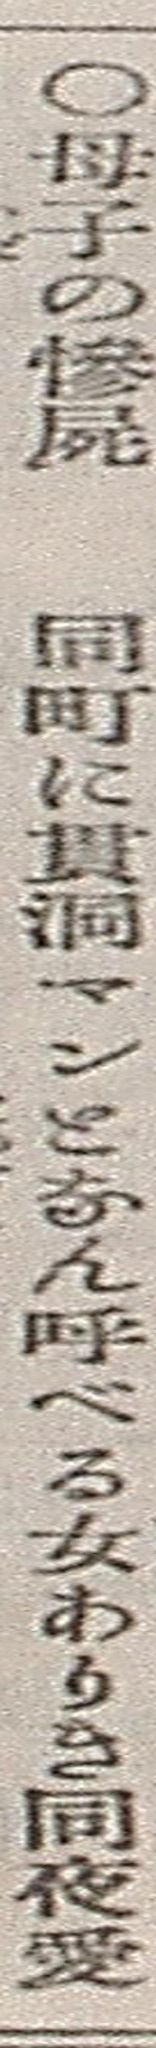○母子の惨屍同町に貫洞マンとなん呼べる女ありき同夜愛
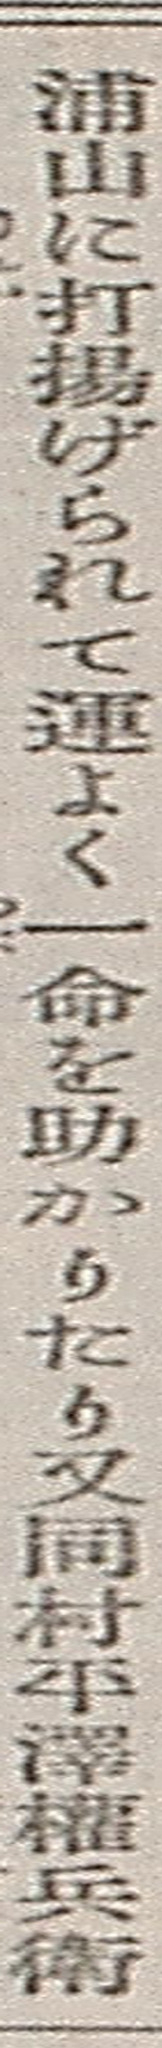浦山に打揚げられて運よく一命を助かりたし又同村平沢権兵衛
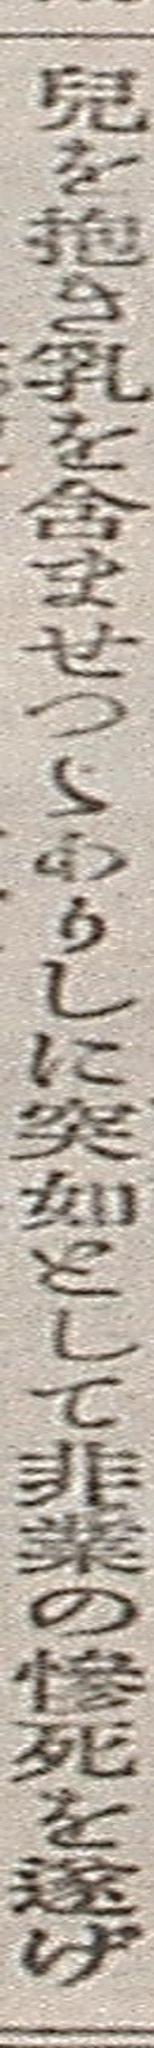児を抱き乳を含ませつゝありしに突如として非業の惨死を遂げ
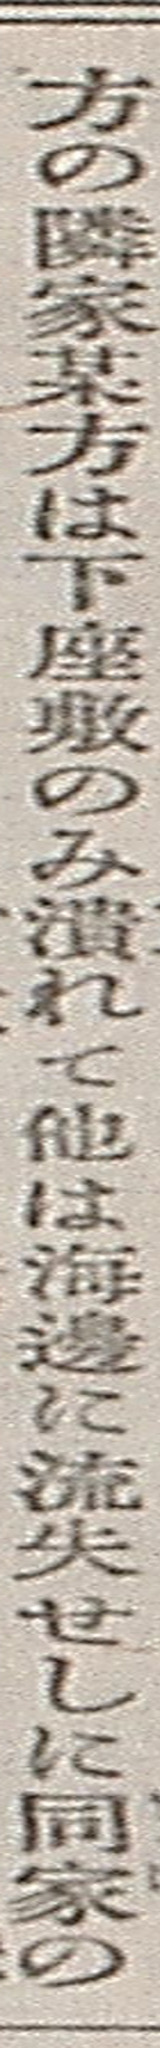方の隣家某方は下座敷のみ潰れて他は海辺に流失せしに同家の
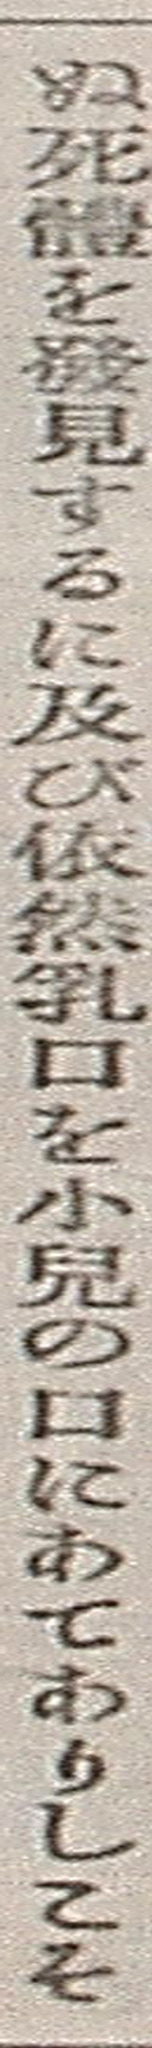ぬ死体を発見するに及び依然乳口を小児の口にあてありしこそ
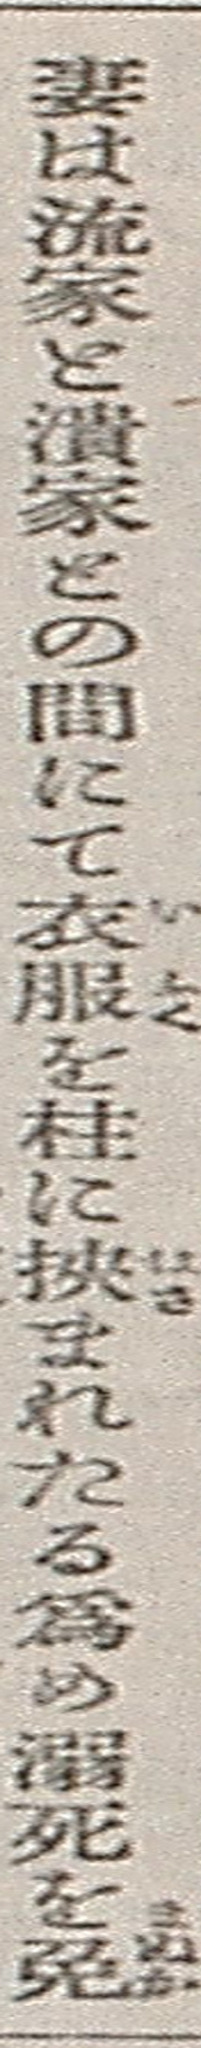妻は流家と潰家との間にて衣服を柱に挟まれたる為め溺死を免
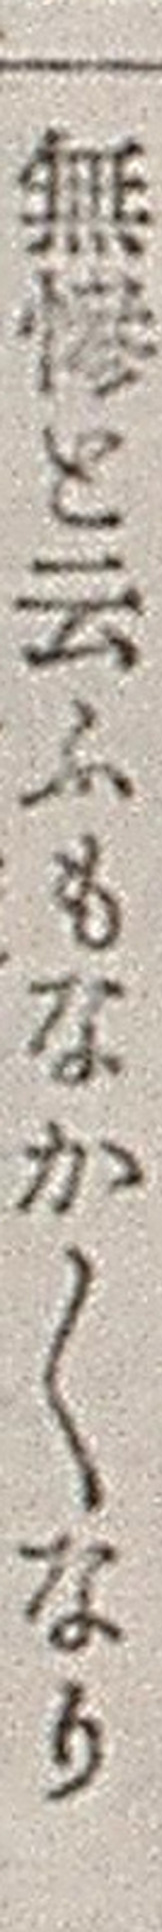無惨と云ふもなか〳〵なり
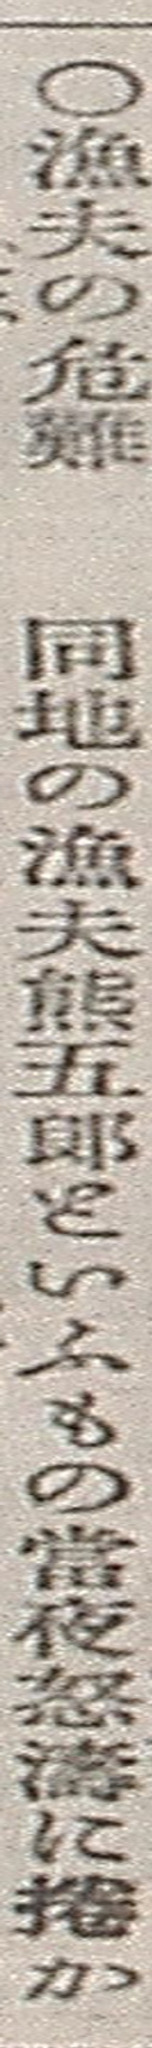○漁夫の危難同地の漁夫熊五郎といふもの当夜怒濤に捲か
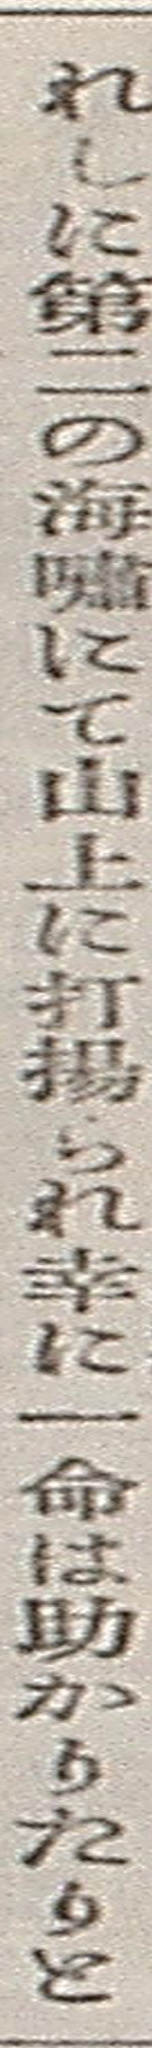れしに第二の海嘯にて山上に打揚られ幸に一命は助かりたりと
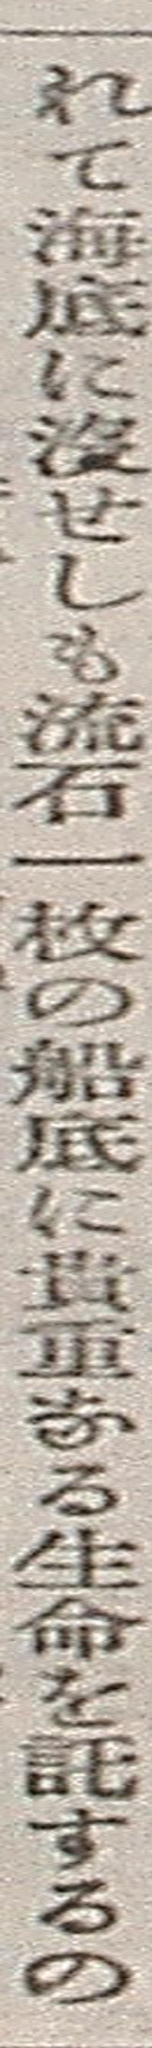れて海底に没せしも流石一枚の船底に貴重なる生命を託するの
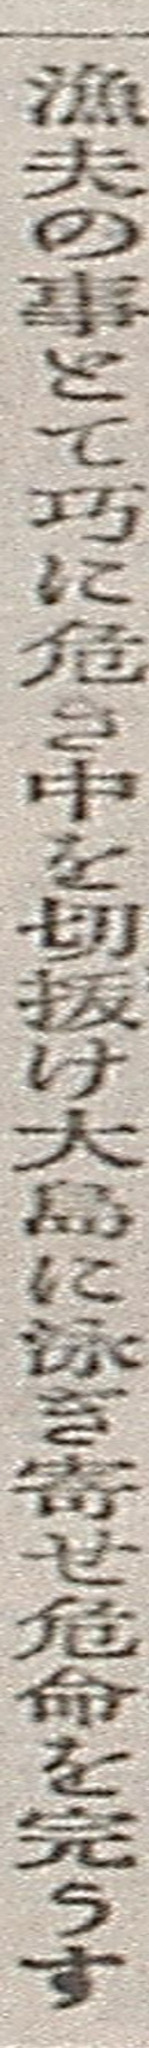漁夫の事とて巧に危き中を切抜け大島に泳ぎ寄せ危命を完うす
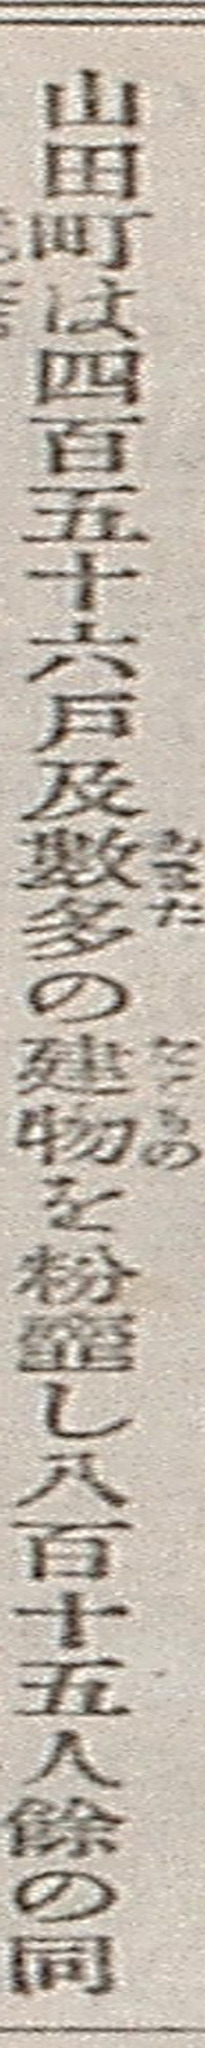山田町は四百五十六戸及数多の建物を粉韲し八百十五人余の同
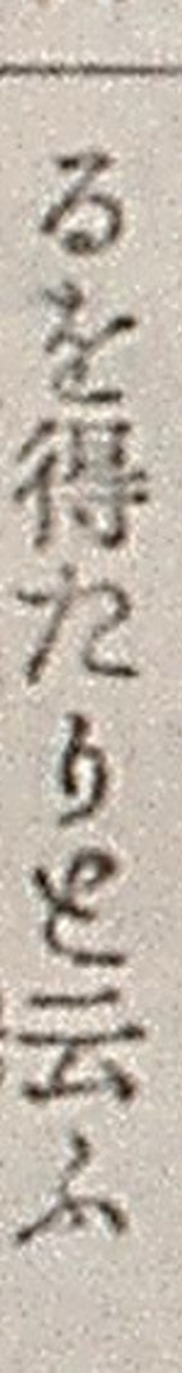るを得たりと云ふ
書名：風俗畫報臨時増刊第百十九號　大海嘯被害録（中）
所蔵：東京大学地震研究所図書室 Earthquake Research Institute Library, The University of Tokyo, JAPAN
